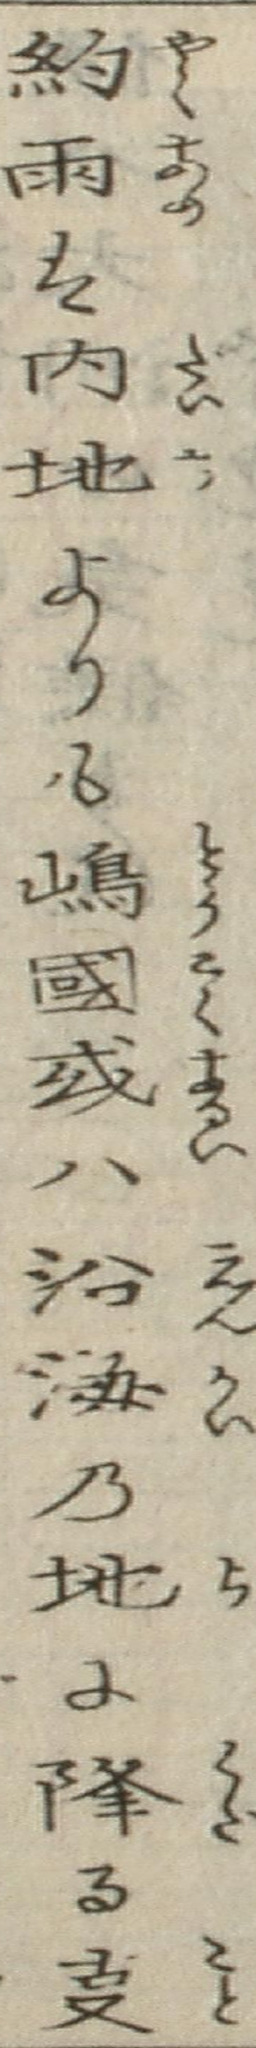約雨は内地よりも嶋国或は沿海の地に降る事
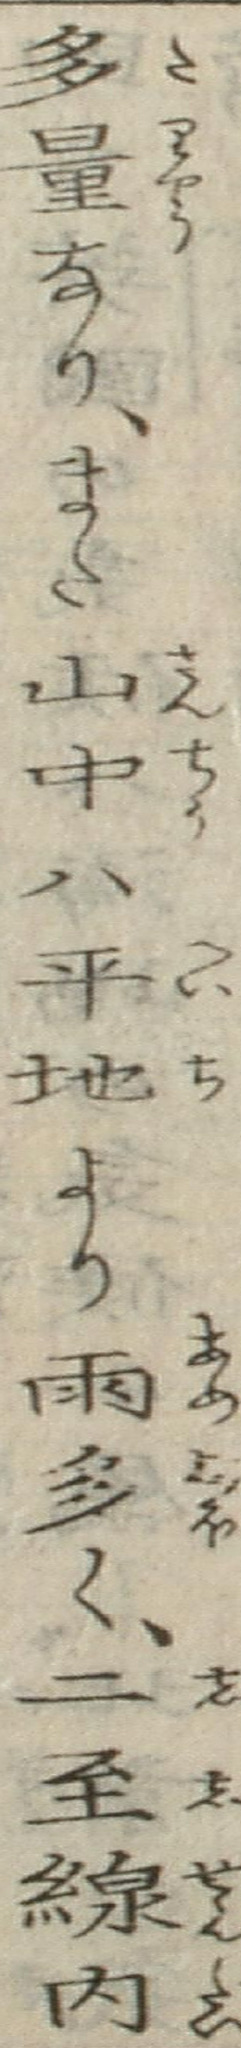多量なり、また山中は平地より雨多く、二至線内
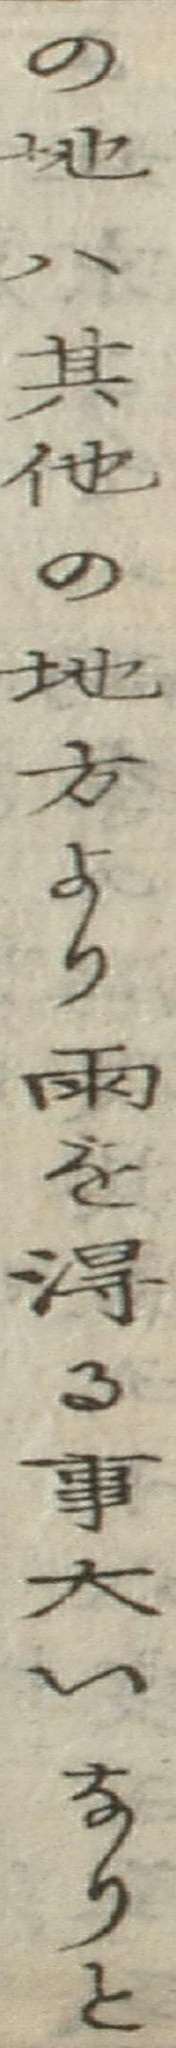の地は其他の地方より雨を得る事大いなりと
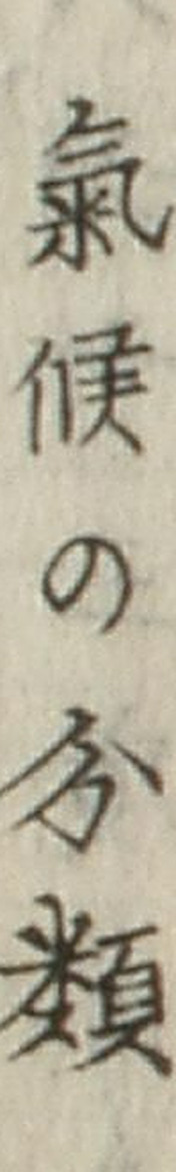気候の分類
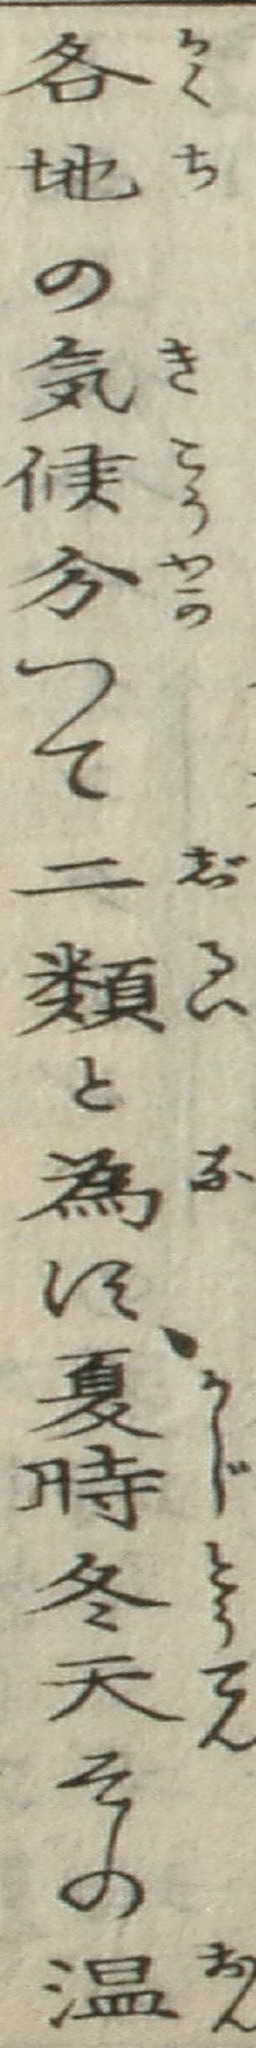各地の気候分つて二類と為す、夏時冬天その温
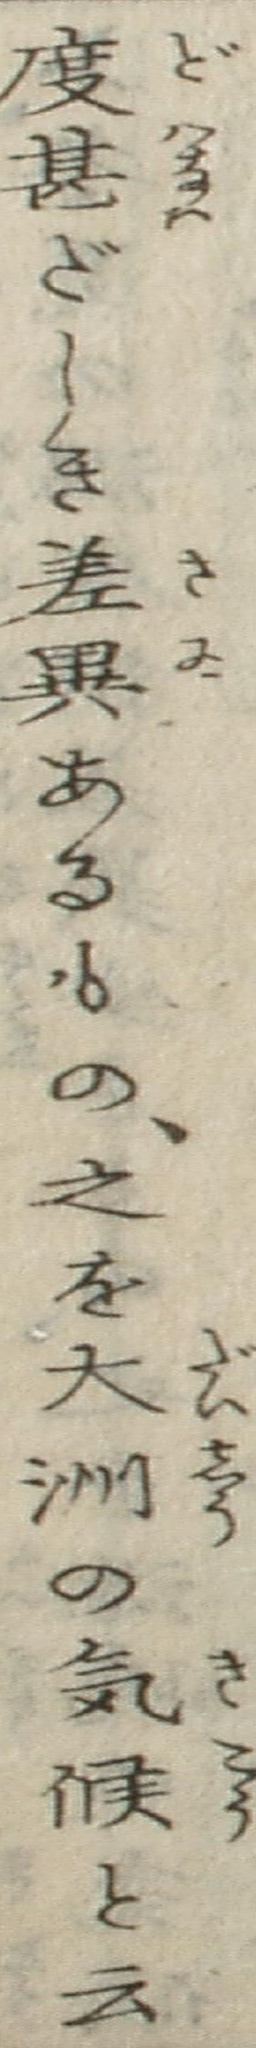度甚だしき差異あるもの、之を大洲の気候と云

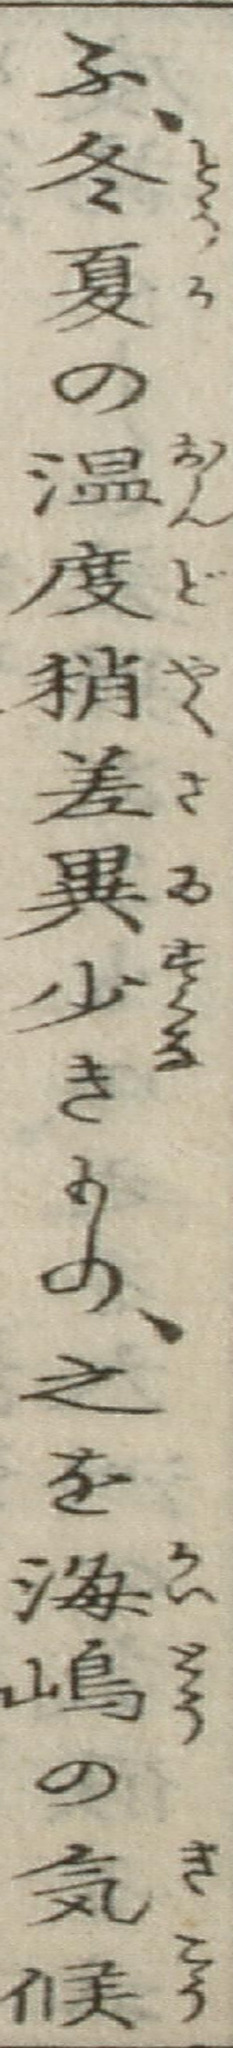ふ、冬夏の温度稍差異少きもの、之を海島の気候
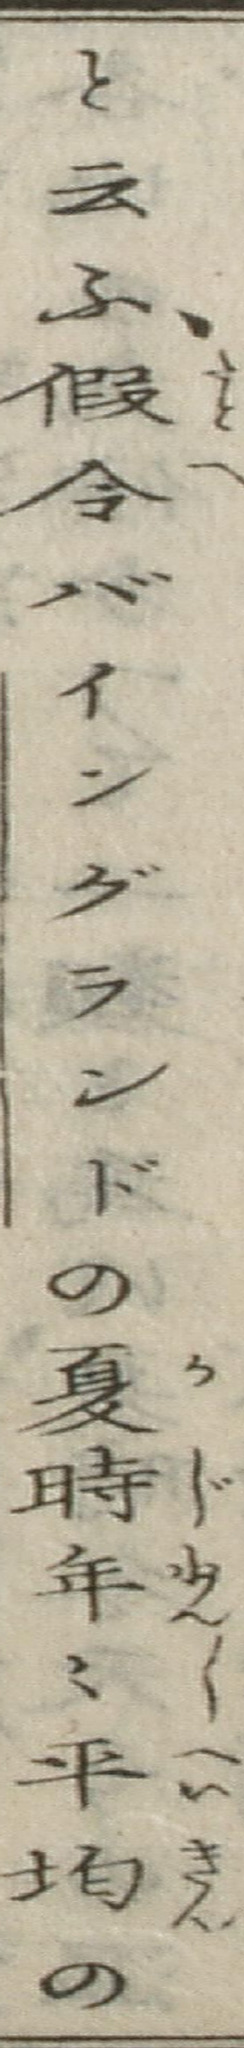と云ふ、仮令バイングランドの夏時年々平均の
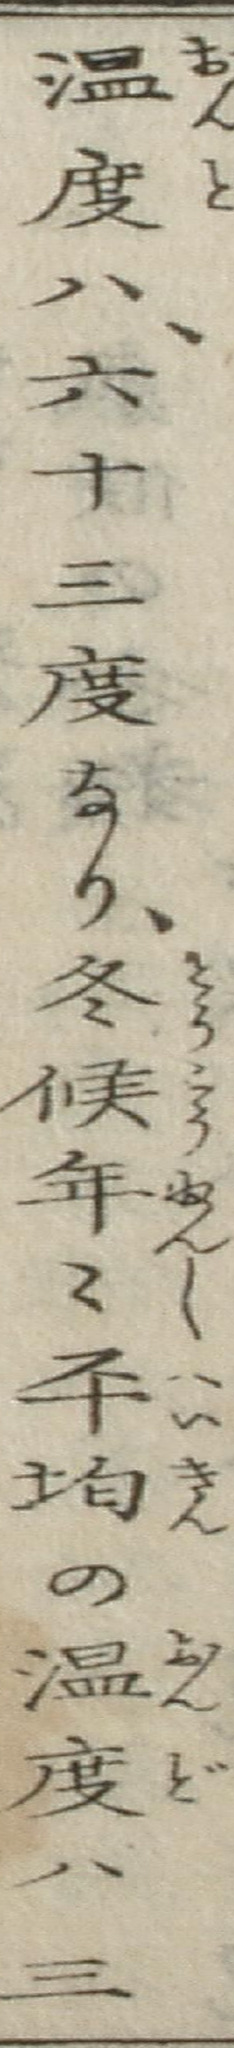温度は、六十三度なり、冬候年々平均の温度は三
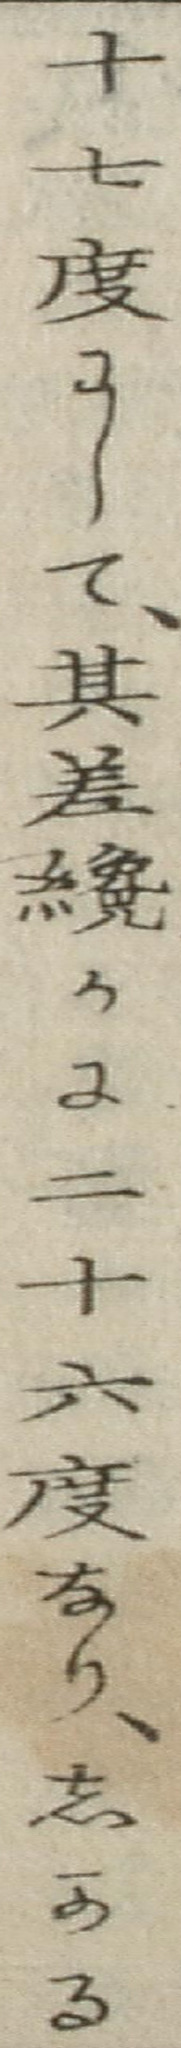十七度にして、其差僅かに二十六度なり、しかる
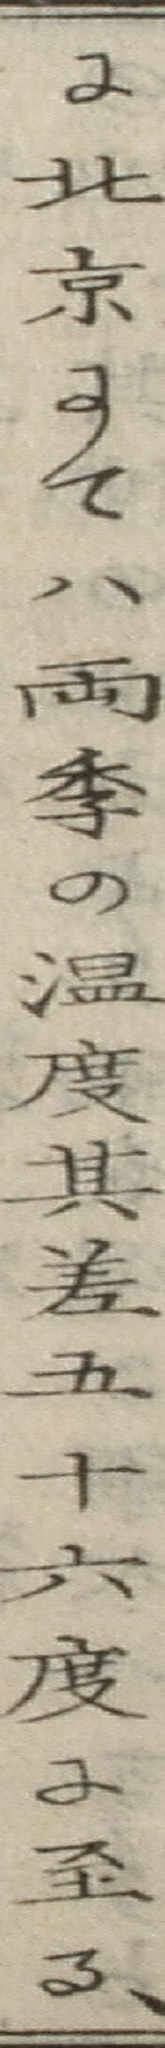に北京にては両季の温度其差五十六度に至る、
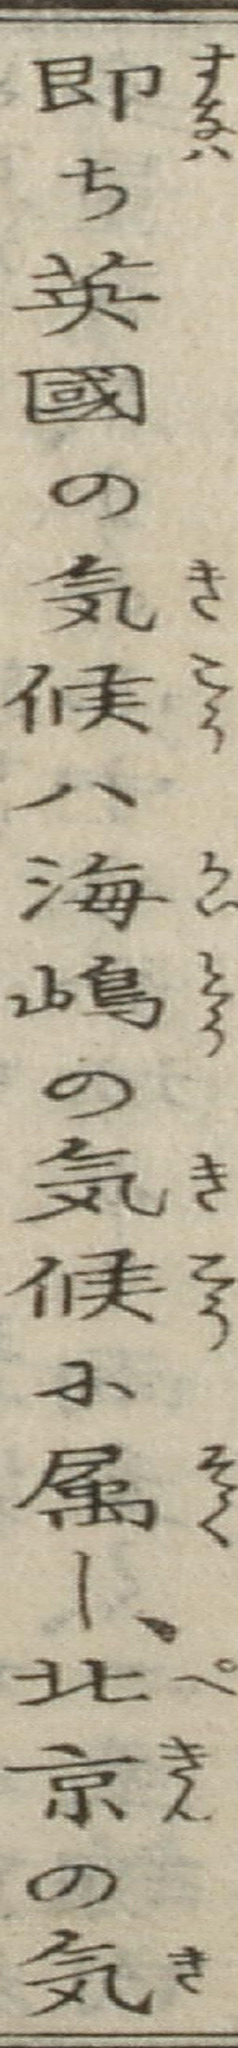即ち英国の気候は海島の気候に属し、北京の気
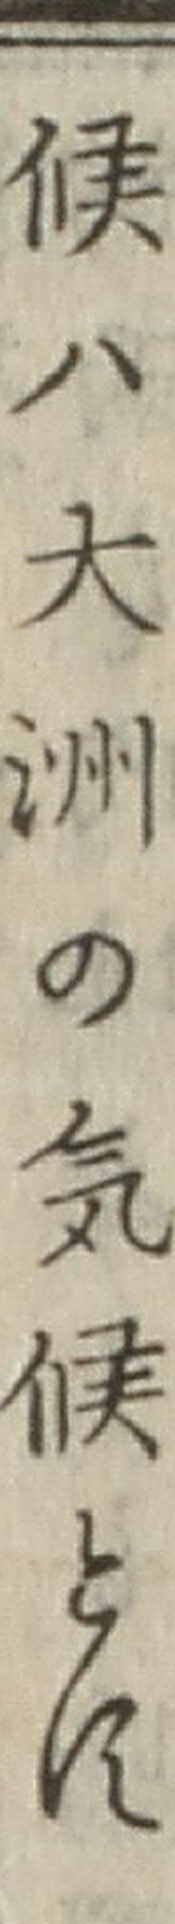候は大洲の気候とす
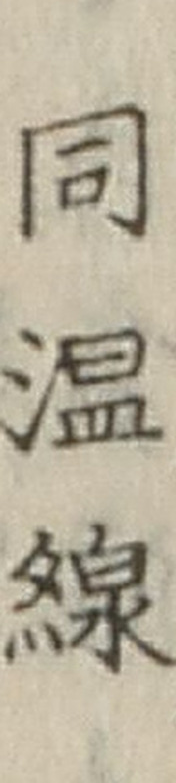同温線
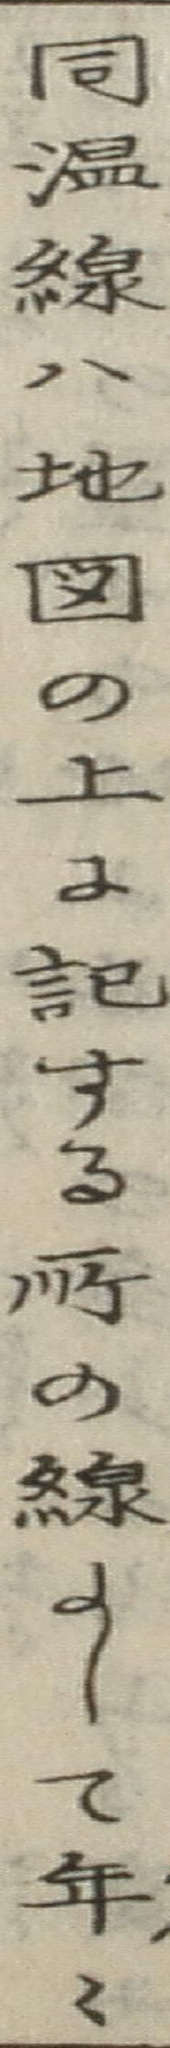同温線は地図の上に記す所の線にして年々

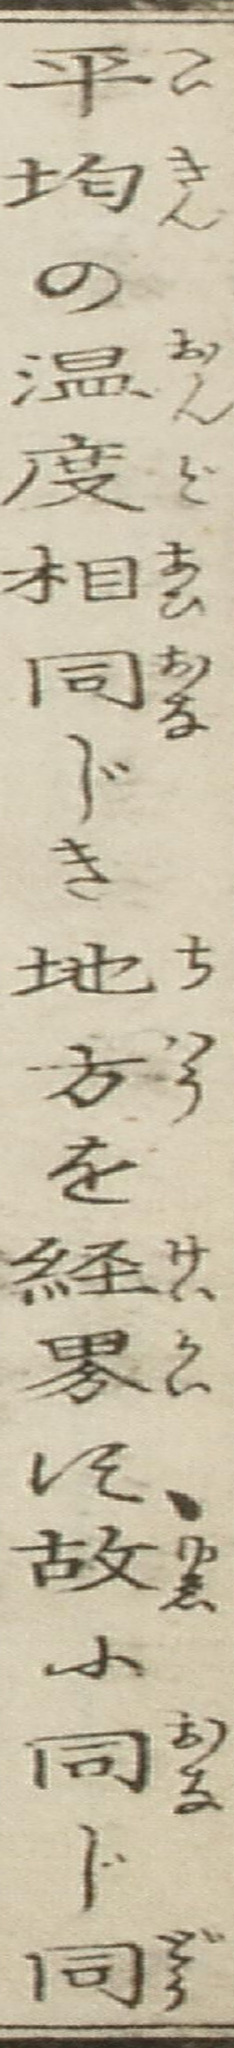平均の温度相同じき地方を経界す、故に同じ同
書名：訓蒙　天然地理學　下
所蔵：東京大学地震研究所図書室 Earthquake Research Institute Library, The University of Tokyo, JAPAN
